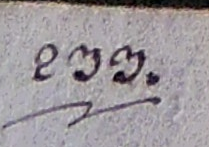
233.
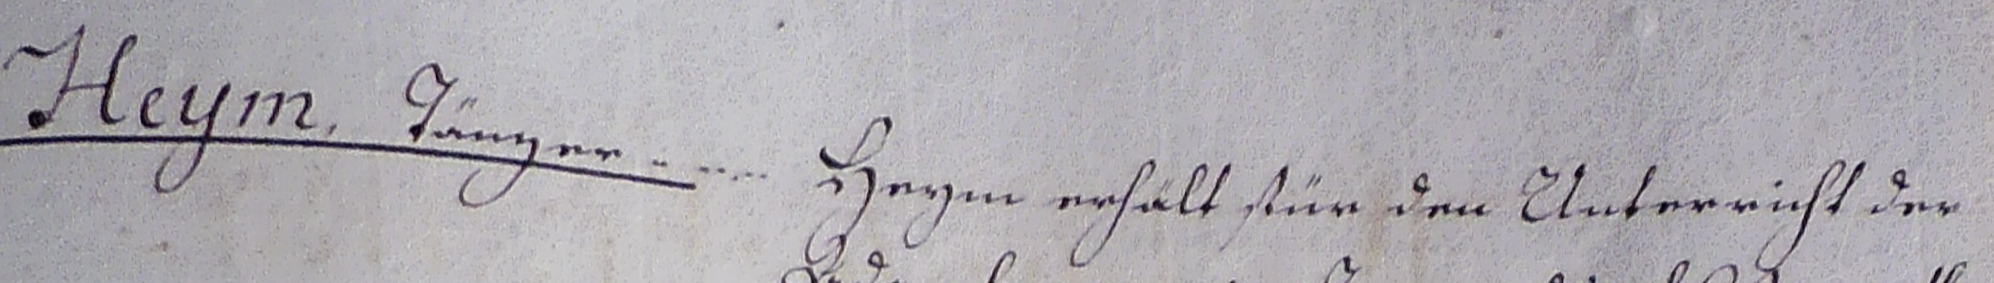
Heym, Tänzer .. .. .. Heym erhält für den Unterricht der
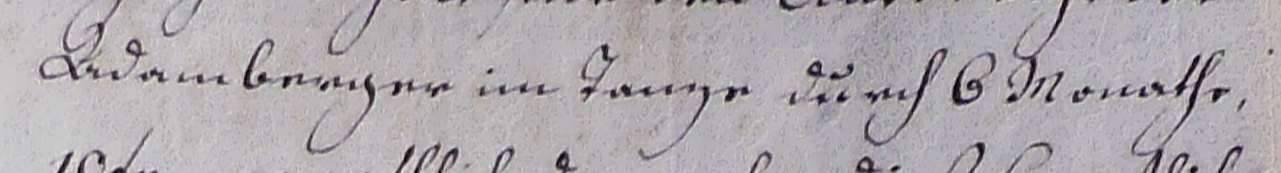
Adamberger im Tanze durch 6 Monathe,
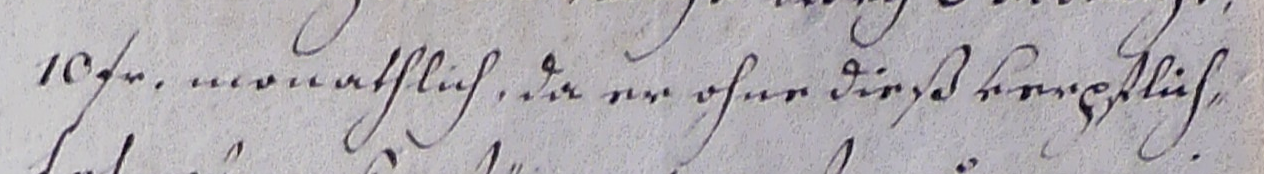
10fr. monathlich, da er ohne dieß verpflich¬
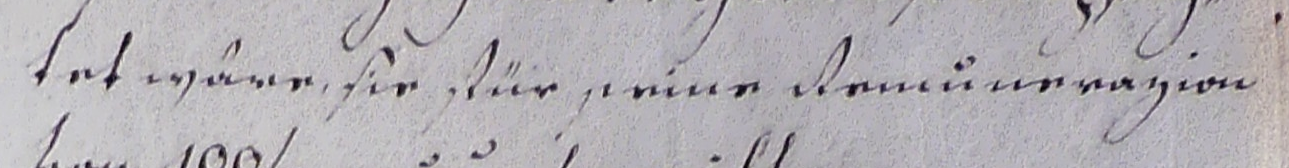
tet wäre, sie für seine Remunerazion
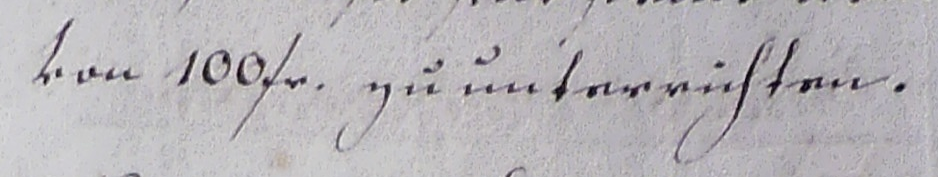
von 100fr. zu unterrichten.
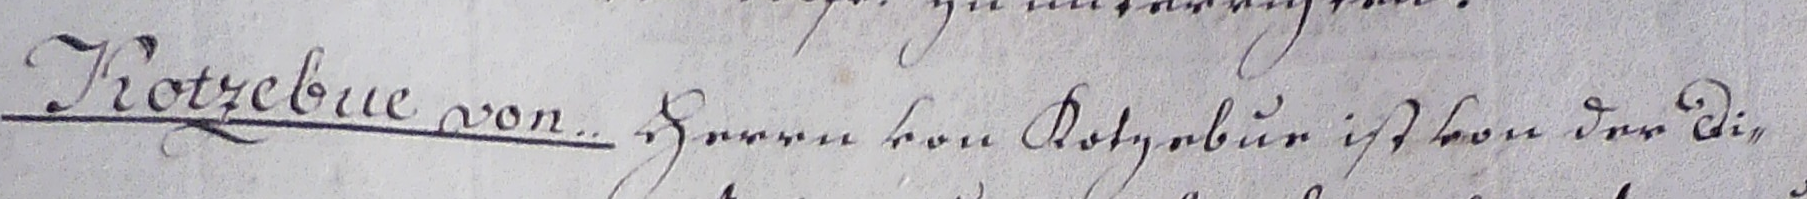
Kotzebue von .. Herrn von Kotzebuer ist von der Di¬
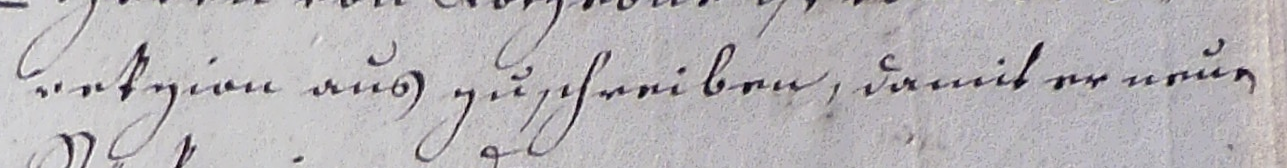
rekzion aus zuschreiben, damit er neue
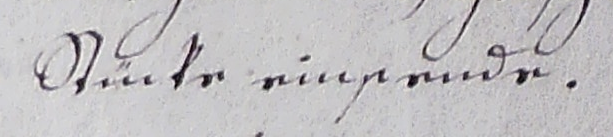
Stücke einsende.
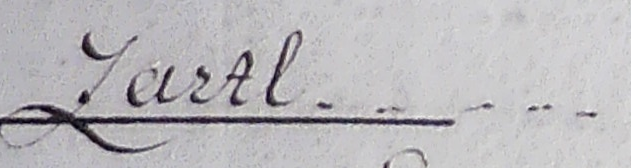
Zartl .. .. .. .. ..
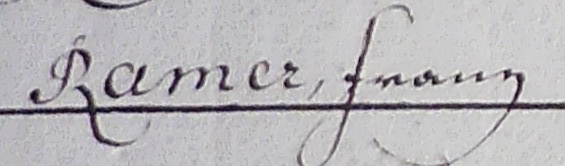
Ramer, Franz
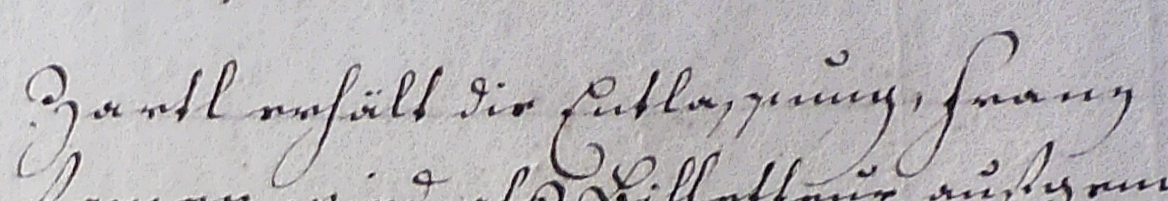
Zartl erhält die Entlassung, Franz
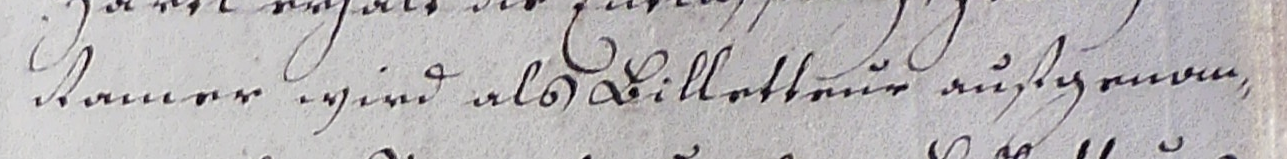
Ramer wird als Billetteur aufgenom¬
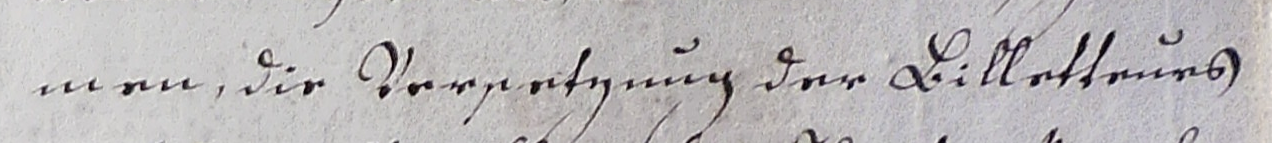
men, die Versetzung der Billetteurs
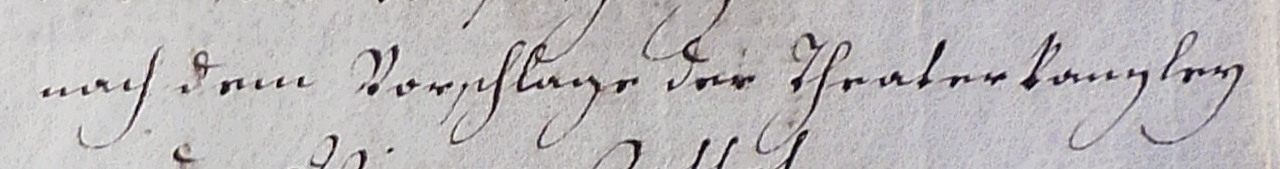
nach dem Vorschlage der Theaterkanzley
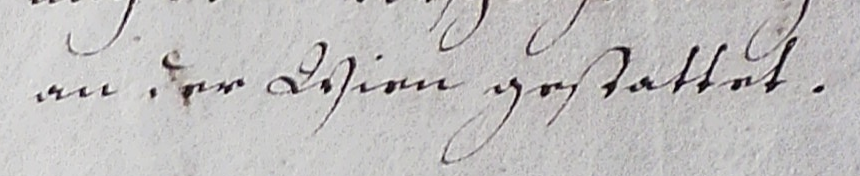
an der Wien gestattet.
